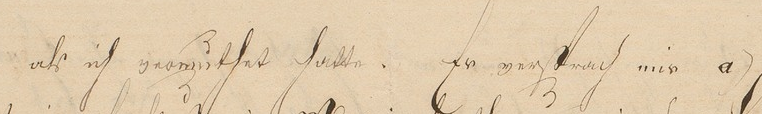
als ich vermuthet hatte. Er versprach mir a)
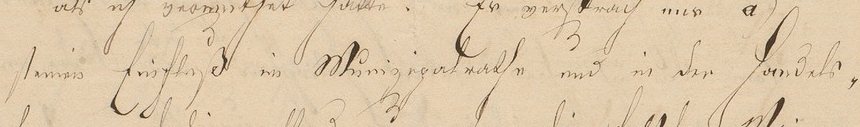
seinen Einfluß im Munizipalrathe und in der Handels-
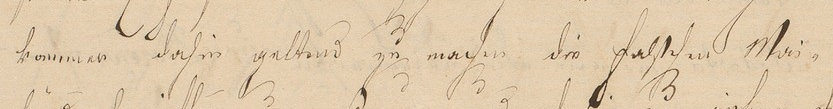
kammer dahin geltend zu machen die falschen Mai-
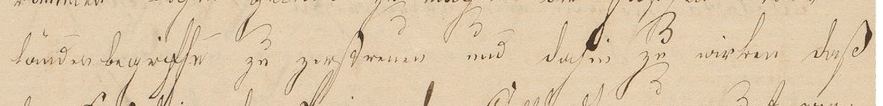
länder begriffe zu zerstreuen und dahin zu wirken daß
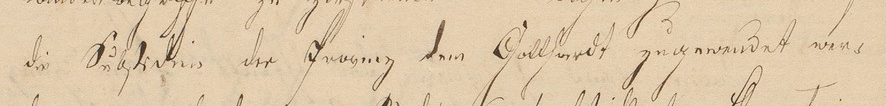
die Subsidien der Provinz dem Gotthardt zugewendet wer-
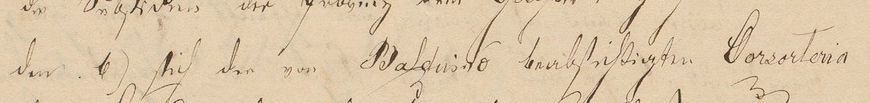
den. b) Sich den von Balduino beabsichtigten Corsorteria
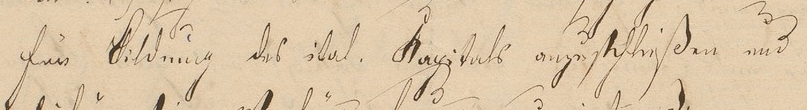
für Bildung des ital. Kapitals anzuschließen und
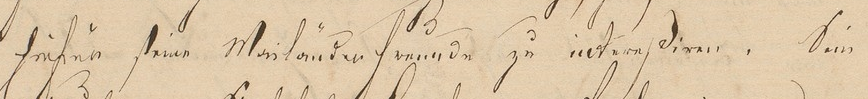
hiefür seine Mailänder Freunde zu intereßiren. Sein
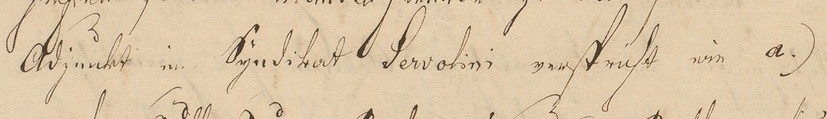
Adjunkt im Syndikat Servoliniverspricht wie a.)
